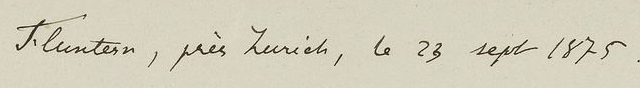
Fluntern, près Zurich, le 23 sept 1875.
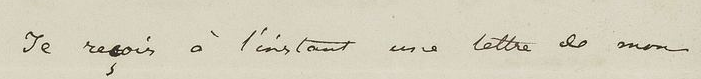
Je reçois à l'instant une lettre de mon
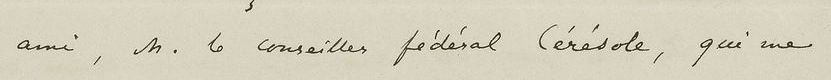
ami, M. le Conseiller fédéral Cérésole, qui me
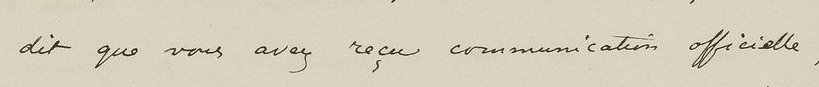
dit que vous avez reçu communication officielle,
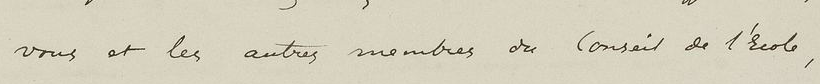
vous et les autres membres du Conseil de l'Ecole
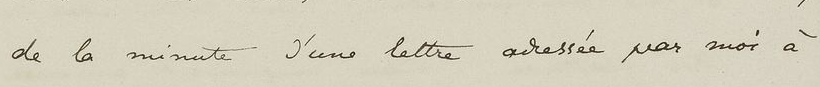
de la minute d'une lettre adressée par moi à
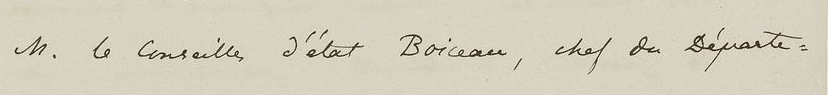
M. le Conseiller d'état Boiceau, chef du Départe-
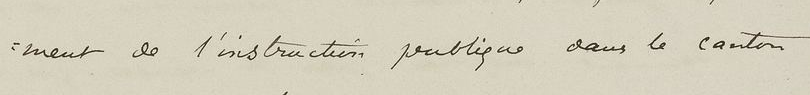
ment de l'instruction publique dans le canton
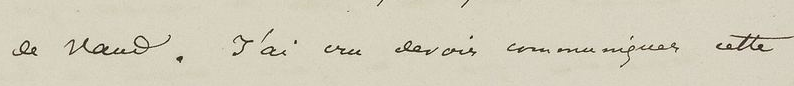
de Vaud. J'ai cru devoir communiquer cette
